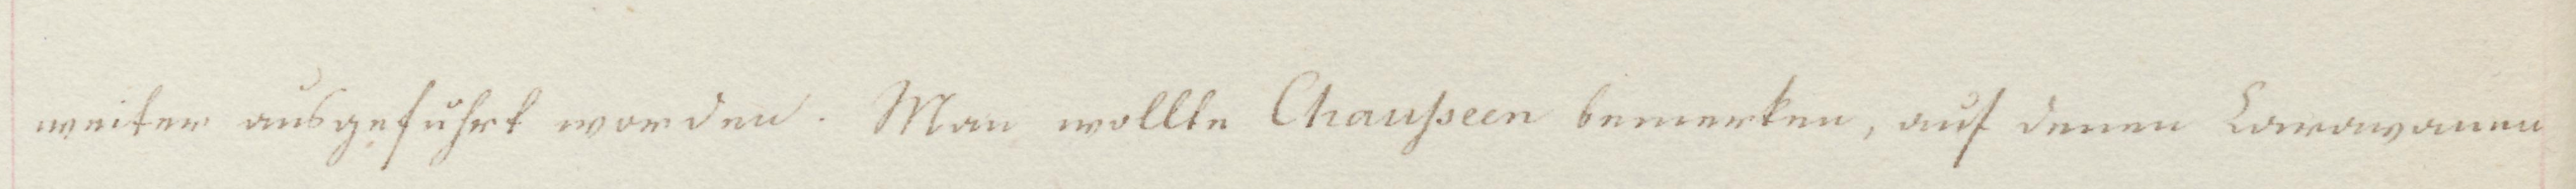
weiter ausgeführt worden. Man wollte Chausseen bemerken, auf denen Caravanen
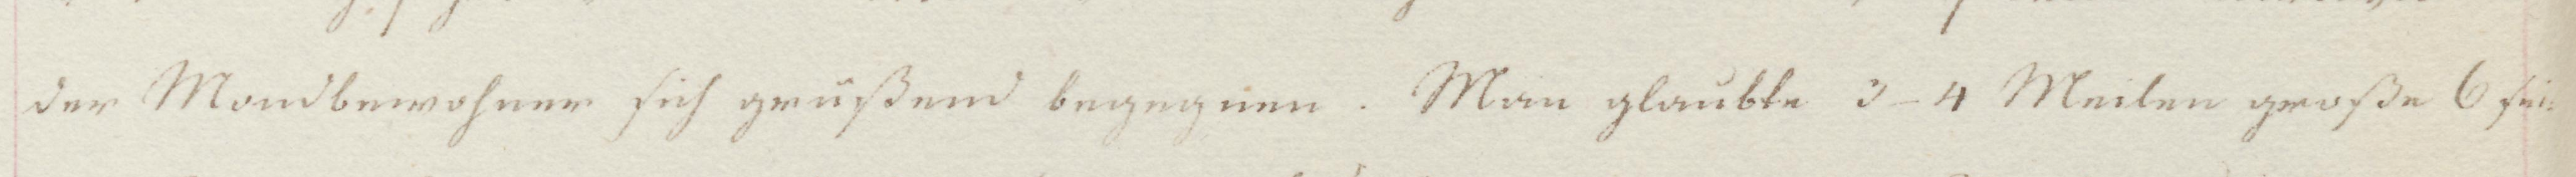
der Mondbewohner sich grüßend begegnen. Man glaubte 3–4 Meilen große 6 sei-
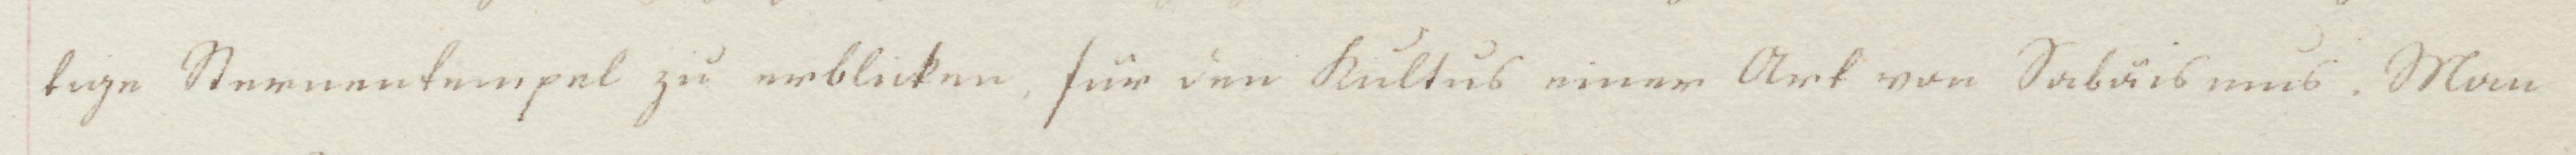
tige Sternentempel zu erblicken, für den Kultus einer Art von Sabäismus. Man
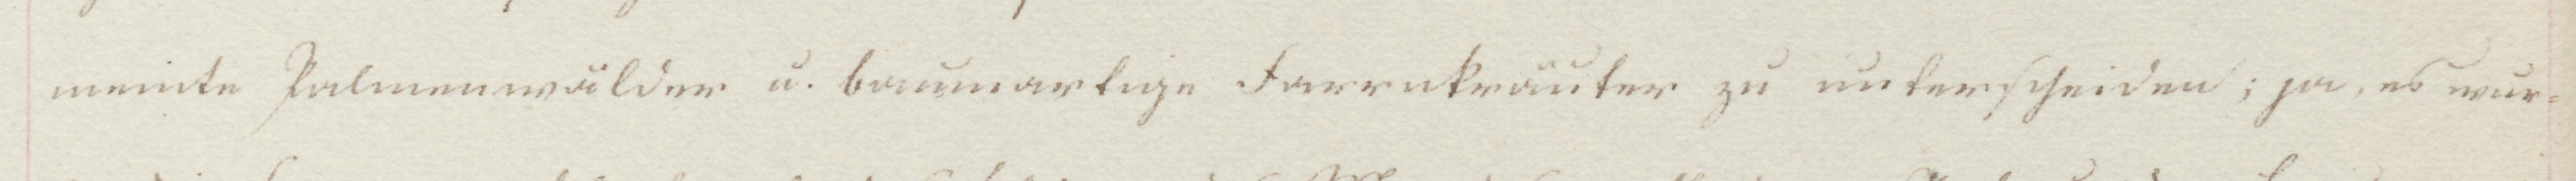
meinte Palmenwälder u. baumartige Farrenkräuter zu unterscheiden; ja, es wur-
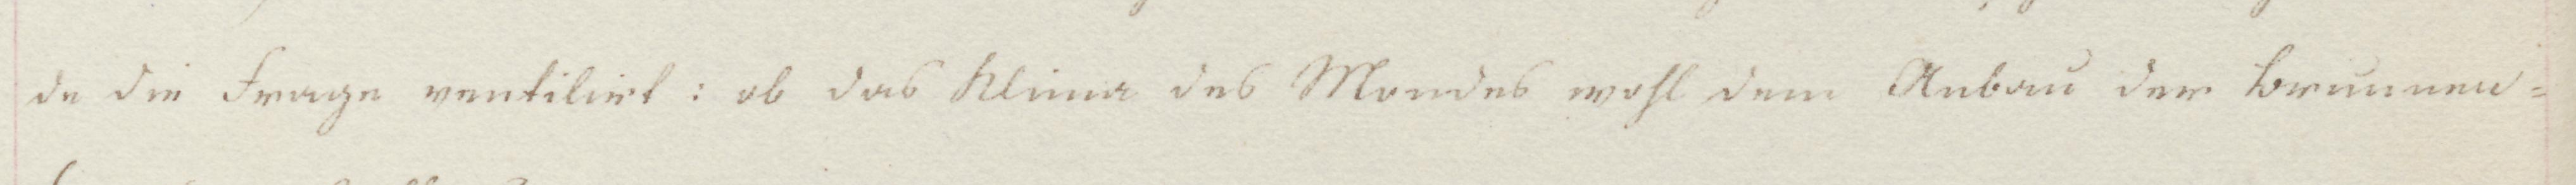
de die Frage ventilirt: ob das Klima des Mondes wohl Anbau der Brunnen-
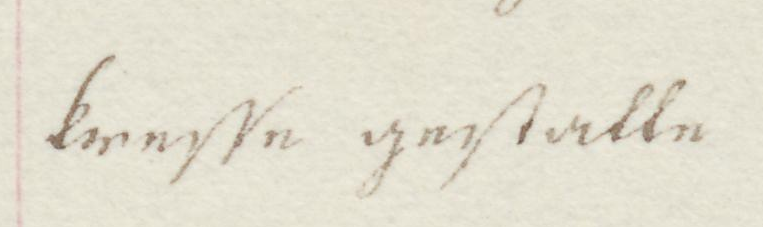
kresse gestatte?
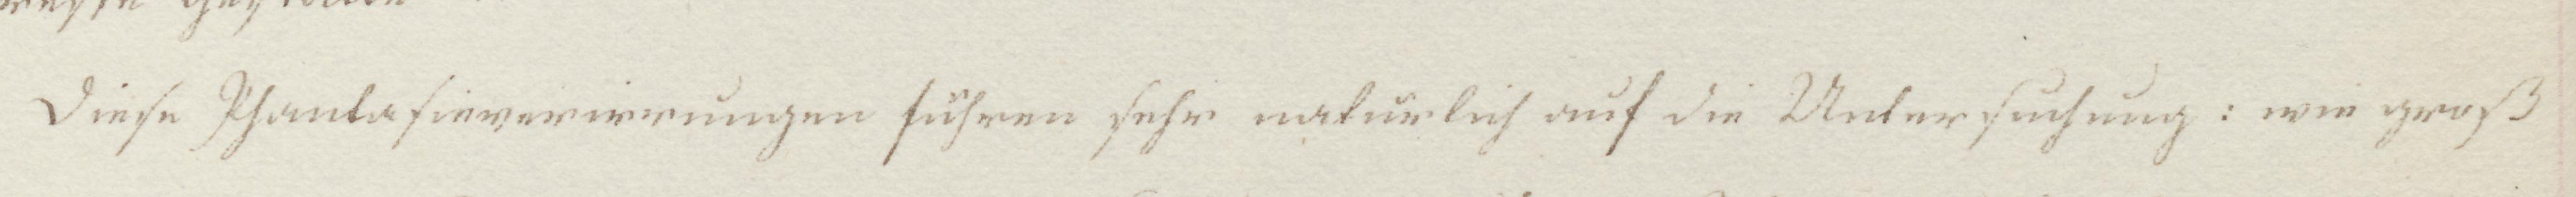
Diese Phantasieverirrungen führen sehr natürlich auf die Untersuchung: wie groß
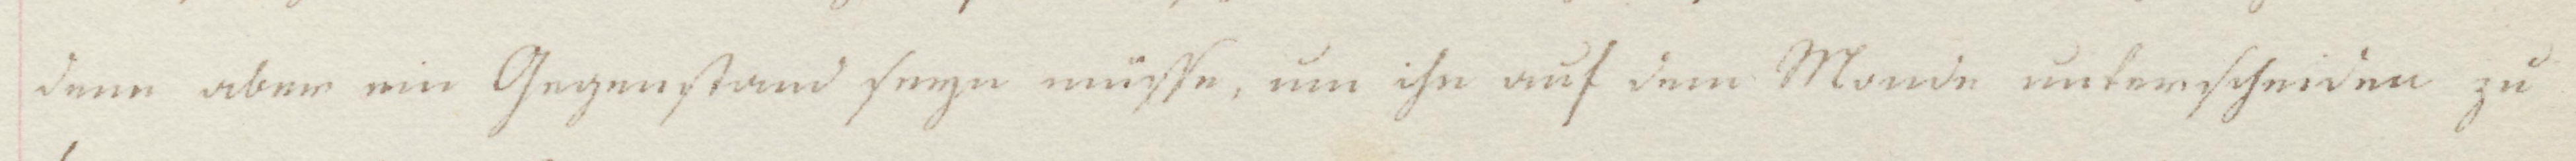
denn aber ein Gegenstand seyn müsse, um ihn auf dem Mond unterscheiden zu
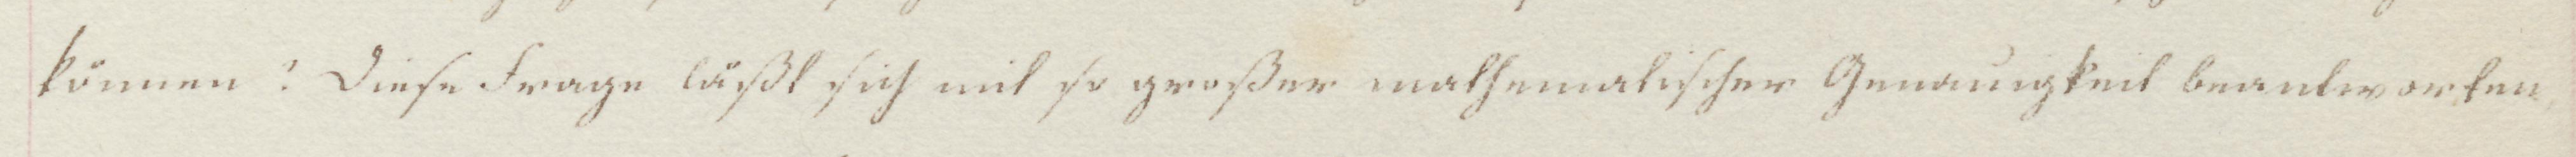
können? Diese Frage läßt sich mit so großer mathematischer Genauigkeit beantworten,
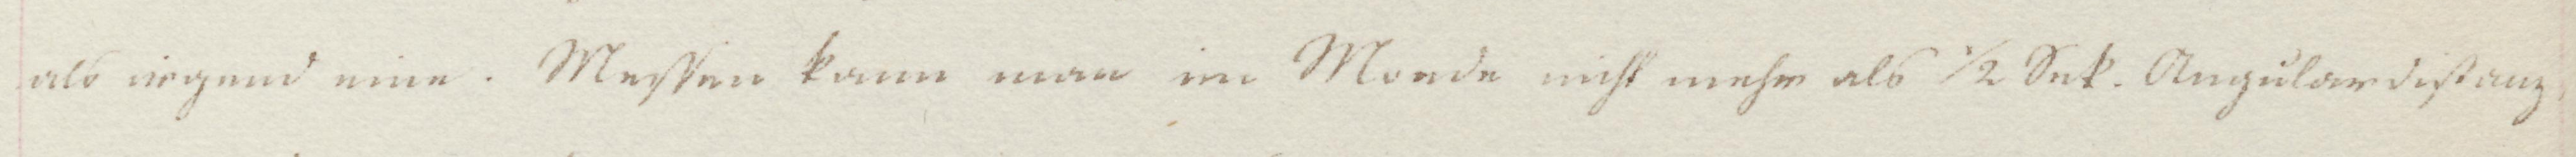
als irgend eine. Messen kann man im Monde nicht mehr als ½ Sek. Angulardistanz,
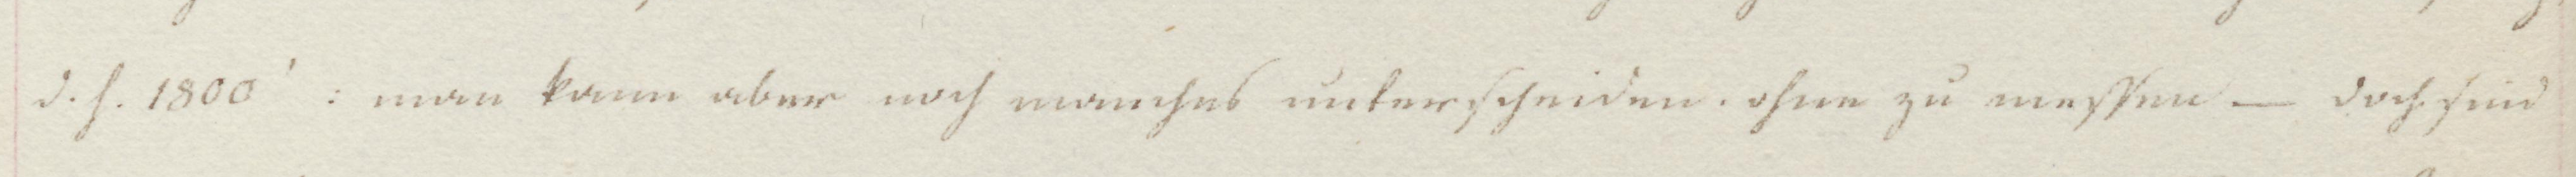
d. h. 1800′: man kann aber noch manches unterscheiden, ohne zu messen – doch sind
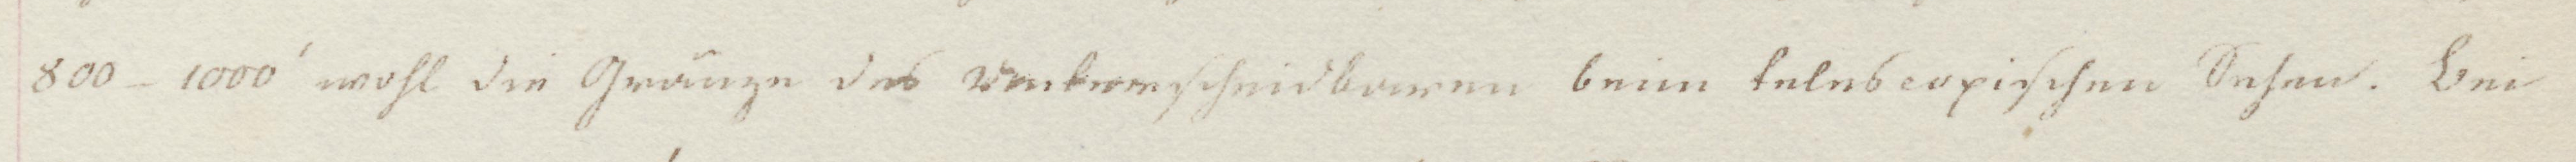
800–1000′ wohl die Gränze des unterscheidbaren beim telescopischen Sehen. Bei
